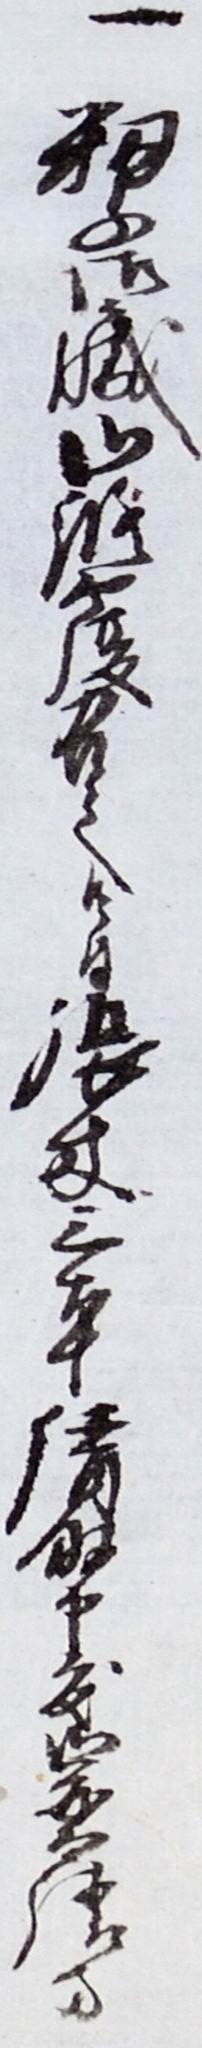一籾子御蔵御修覆有之候ニ付張木三本請取申度御普請方
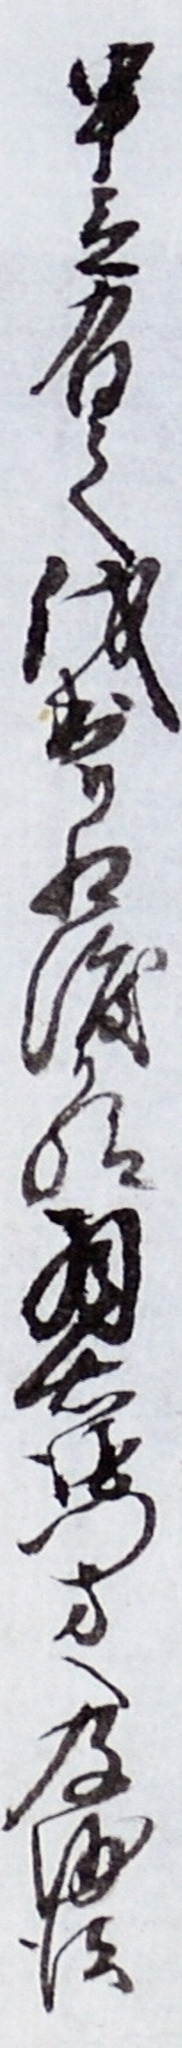半立有之伐出候相渡候様羽右衛門方へ及沙法
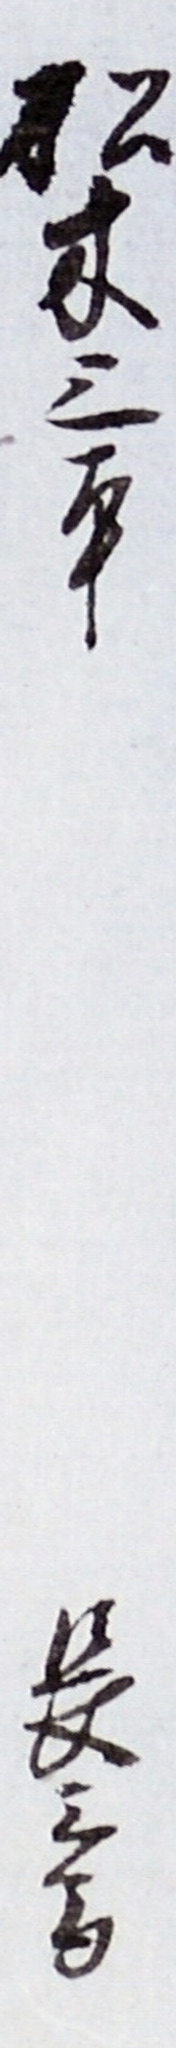松木三本長三間
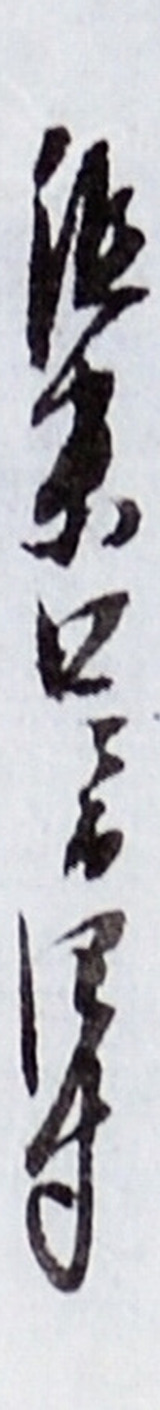継末口ニ而四寸
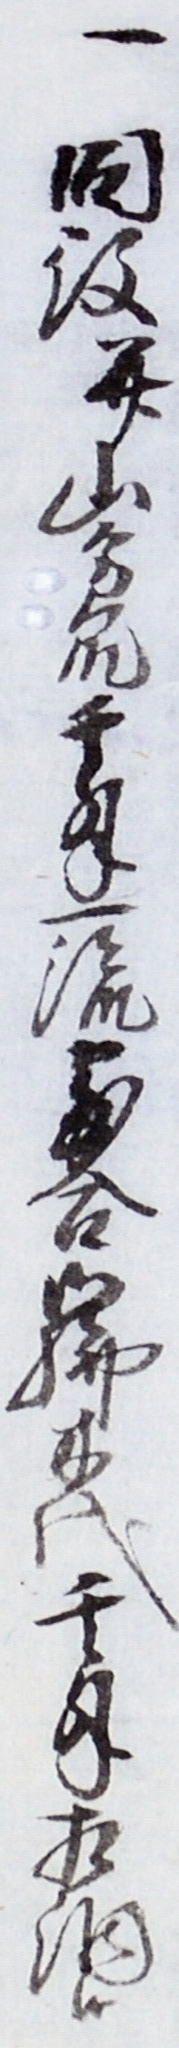一同役并山方衆其外一流寄合御払木代其外相納候
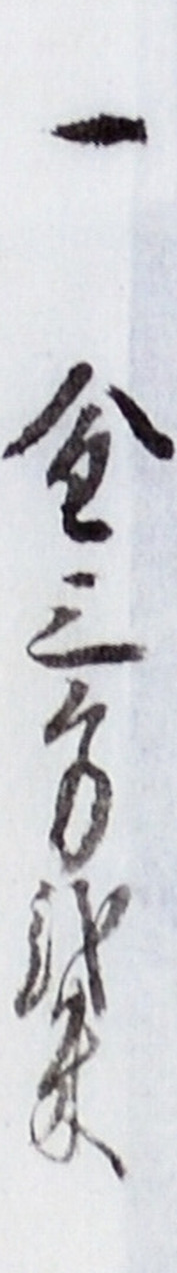一金三分弐朱
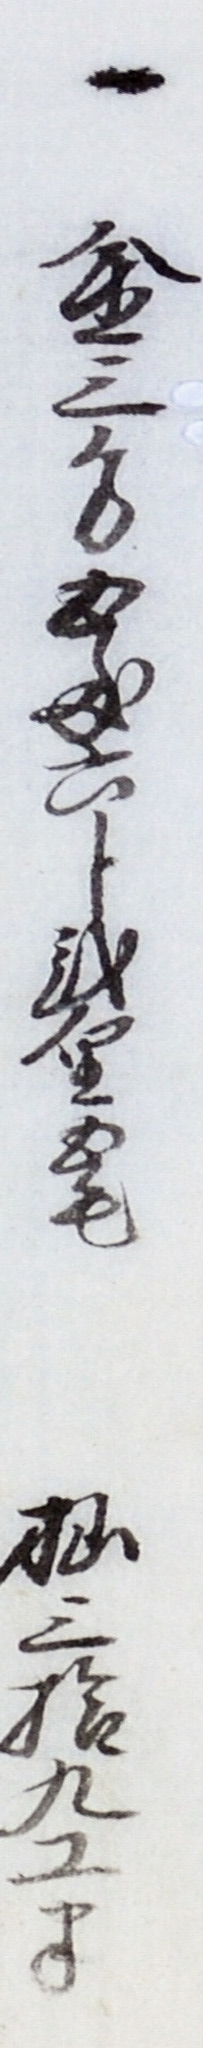一金三分五匁六分弐厘五毛杣三拾九工半
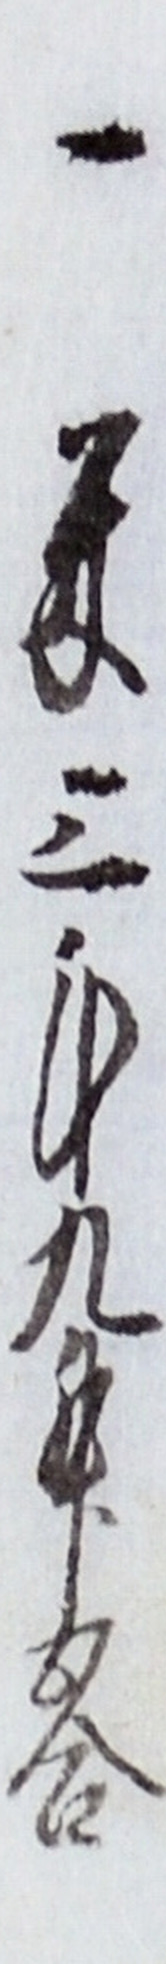一米三斗九升五合
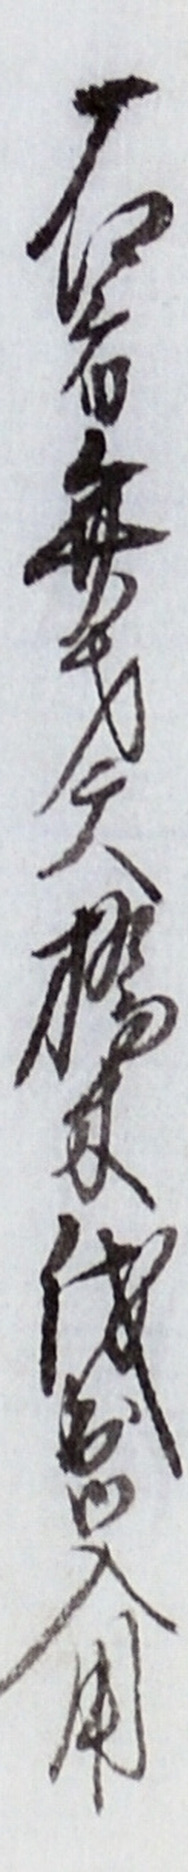右は弁才天橋木伐出御入用
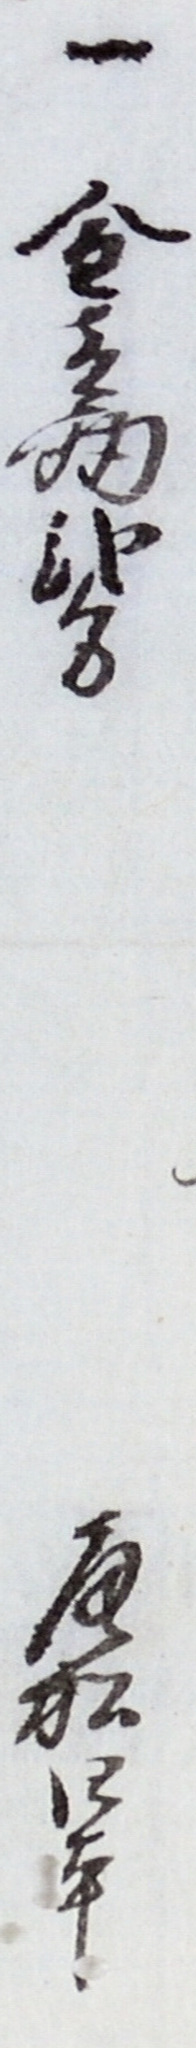一金壱両弐分唐松四本
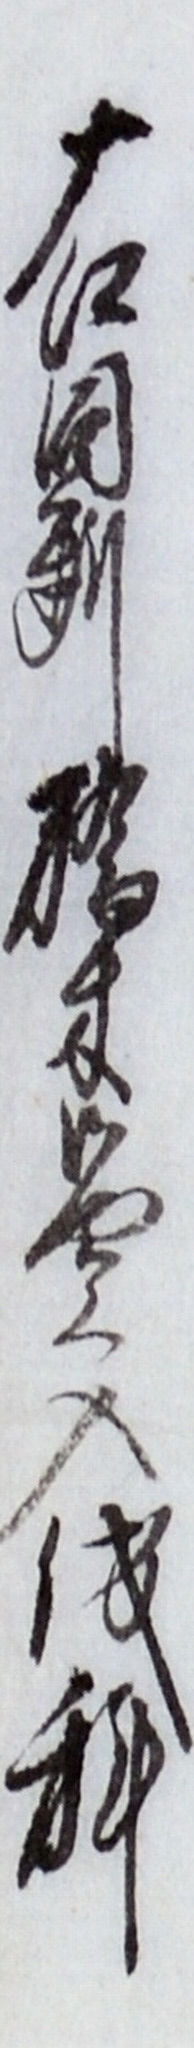右同断橋木御買入伐料
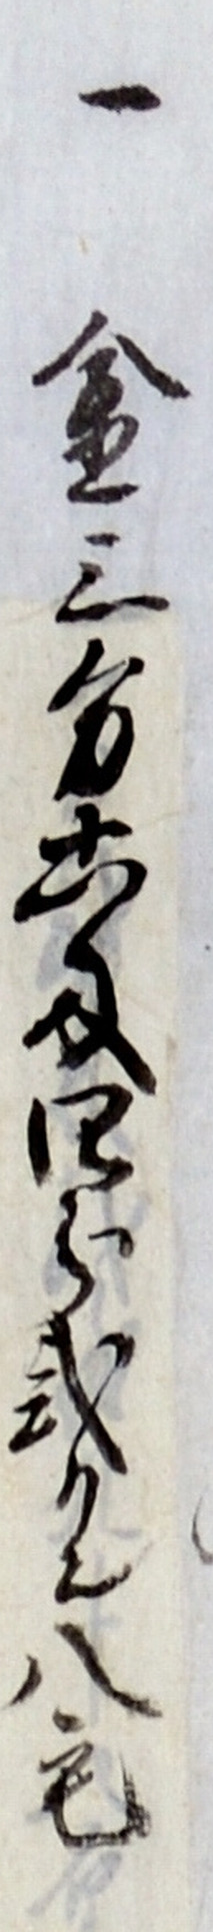一金三分六匁四分弐りん八毛
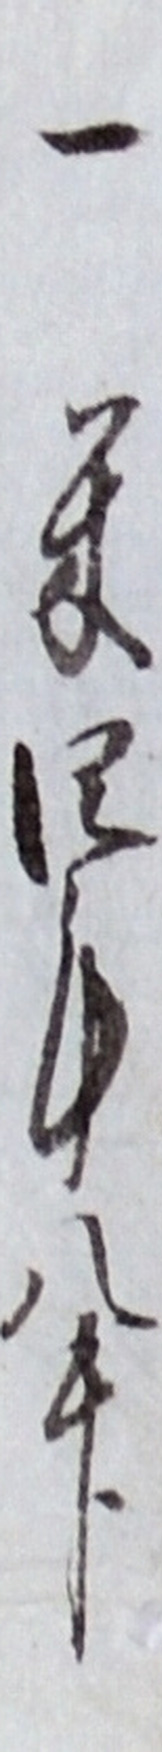一米四斗八升
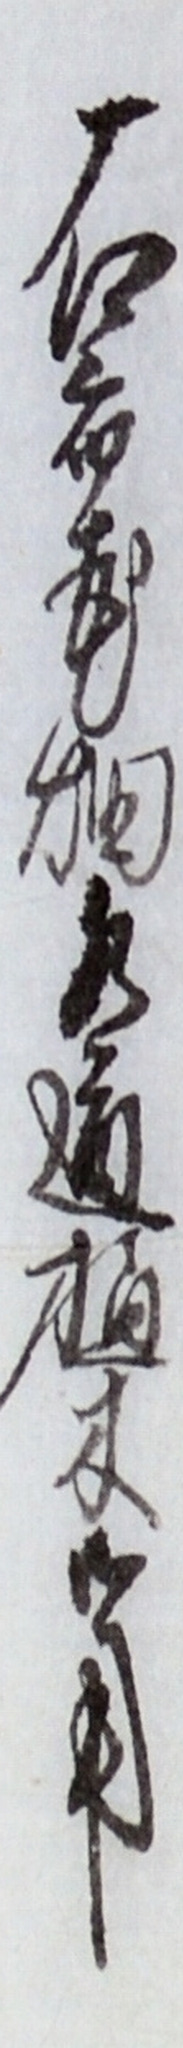右は歩畑水道植木御用
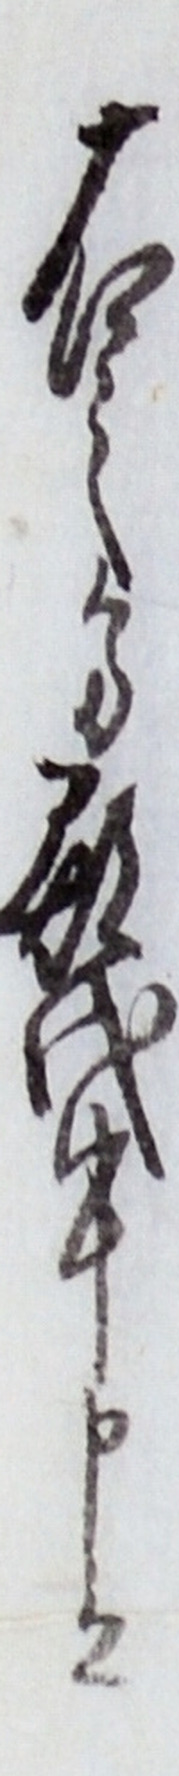右之方郡代中申候

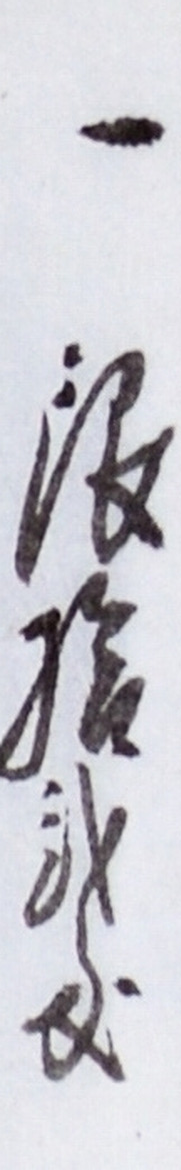一銀拾弐匁
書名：御山奉行御用控
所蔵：伊那市立高遠町図書館・合同会社AMANE
